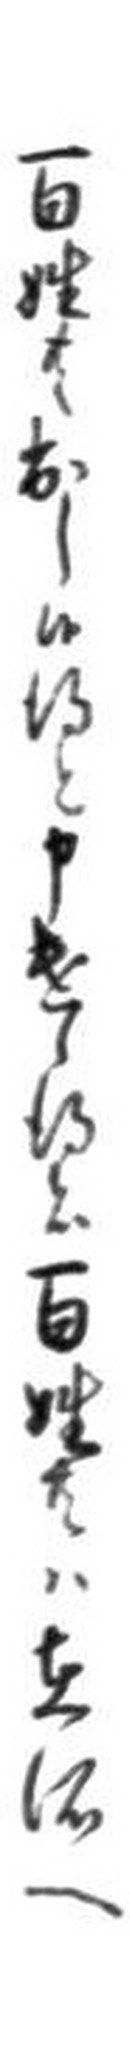百姓共出し候得と申遣候得者百姓共ハ在所へ
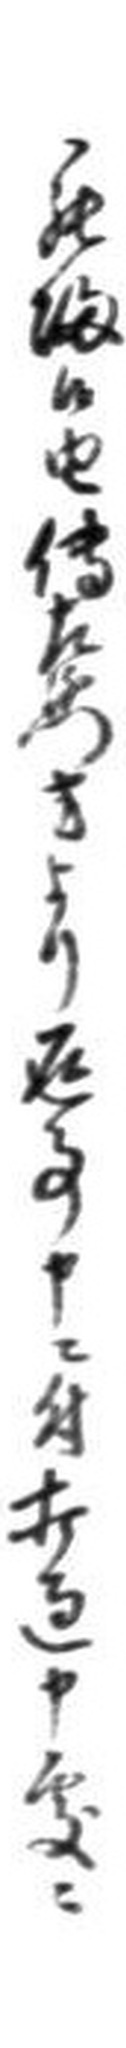罷帰候由伝左衛門方より返事申ニ付打過申処ニ
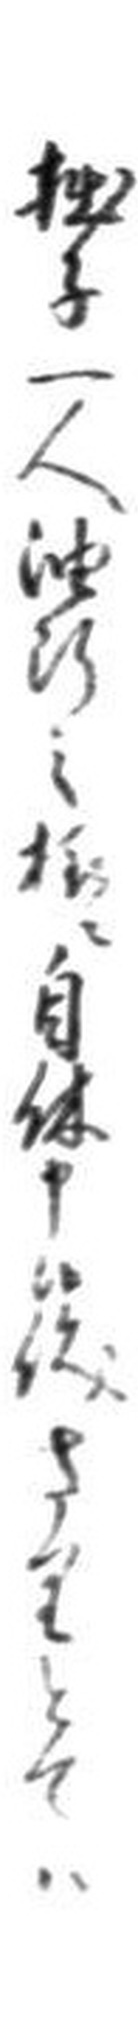拙子一人油断之様ニ自休申候儀さりとてハ
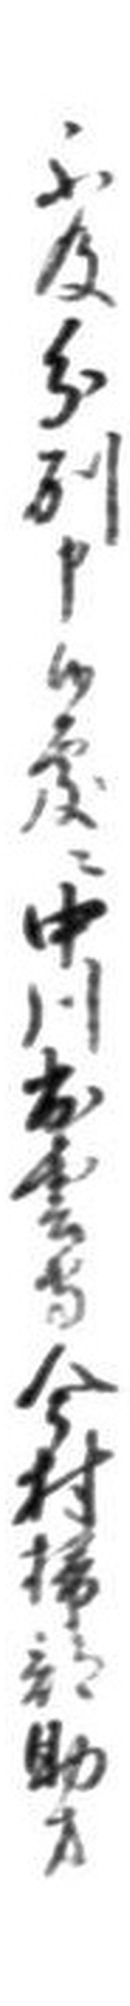不及分別申候処ニ中川出雲守今村掃部助方
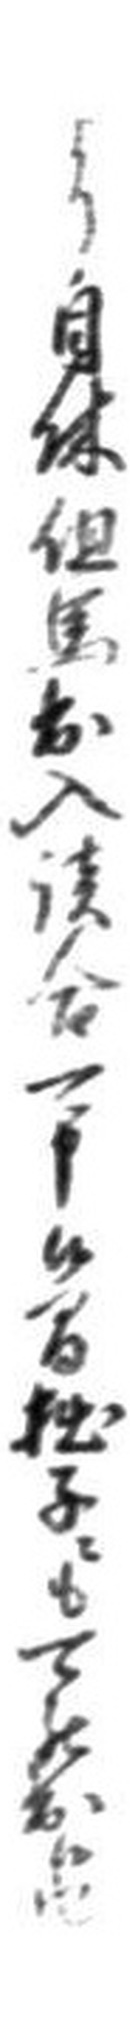より自休但馬出入請合可申候間拙子ニも可罷出候由
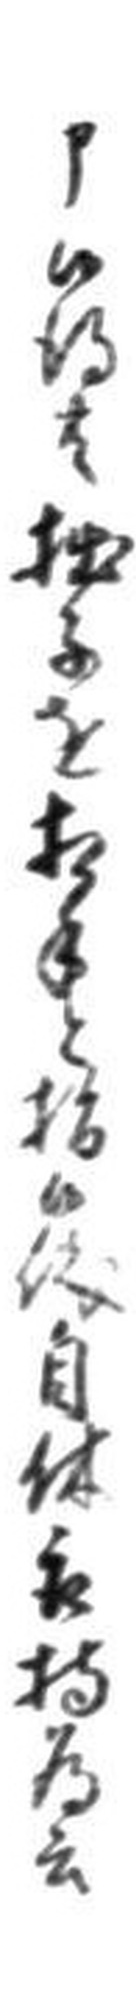申候得共拙子を相手と指候儀自休取持為云
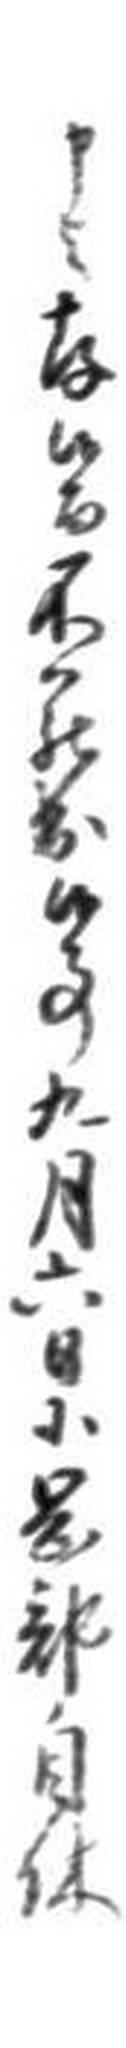申与存候而不罷出候事九月六日に岡部自休
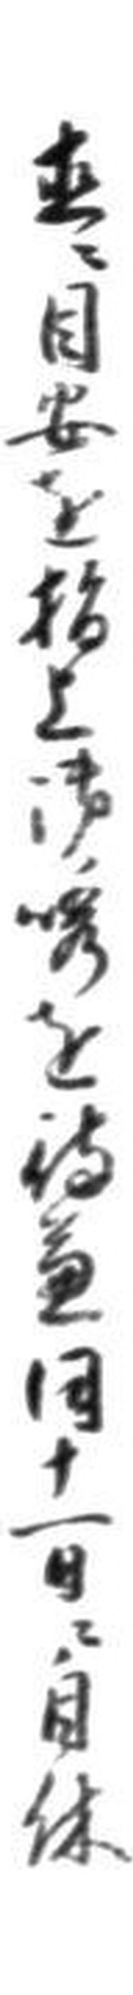直ニ目安を指上御唀を待兼同十一日ニ自休
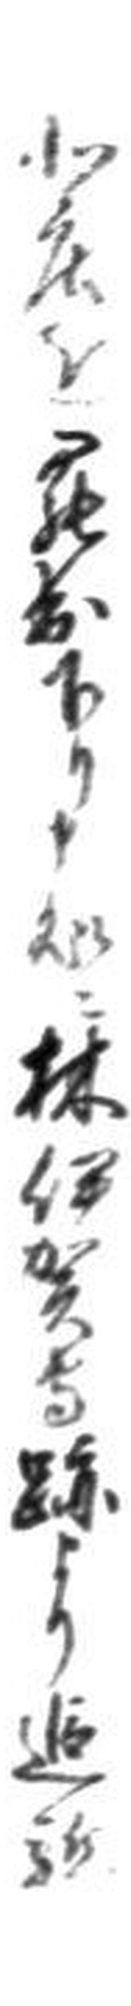北庄を罷出下り申処ニ林伊賀守跡より追駈
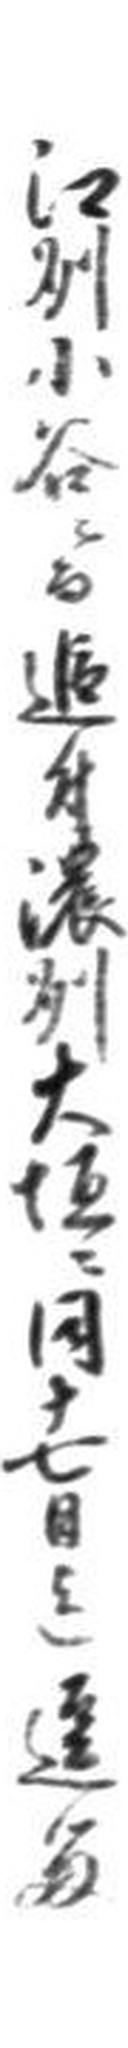江州小谷ニ而追付濃州大垣ニ同十七日迄逗留

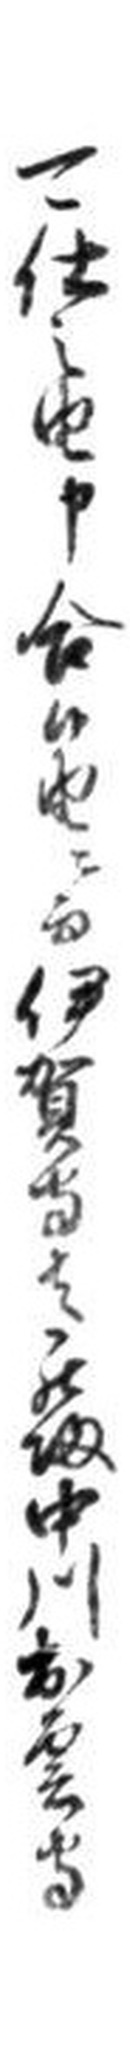可仕之由申合候由ニ而伊賀守者罷帰中川出雲守
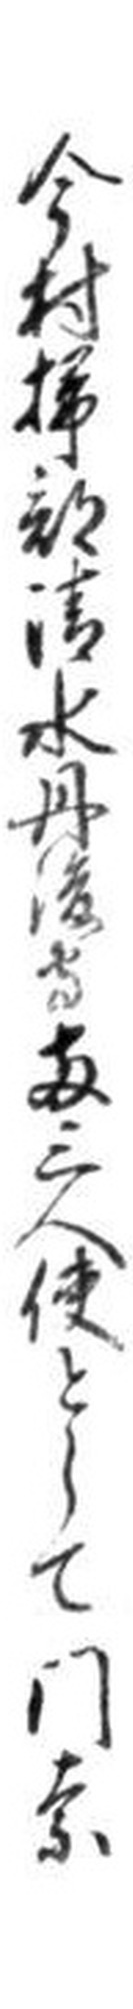今村掃部清水丹後守両三人使として門奈
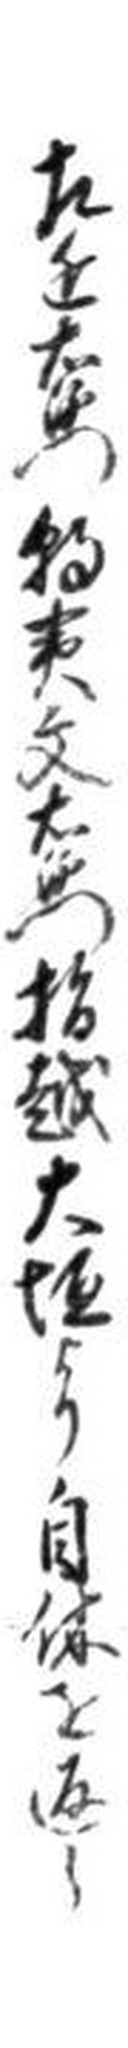左近右衛門朝夷文右衛門指越大垣より自休を返し
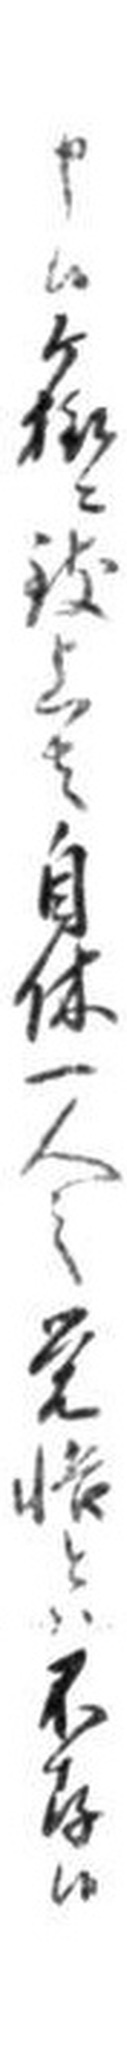申候ケ様ニ致上者自休一人之覚悟とハ不存候
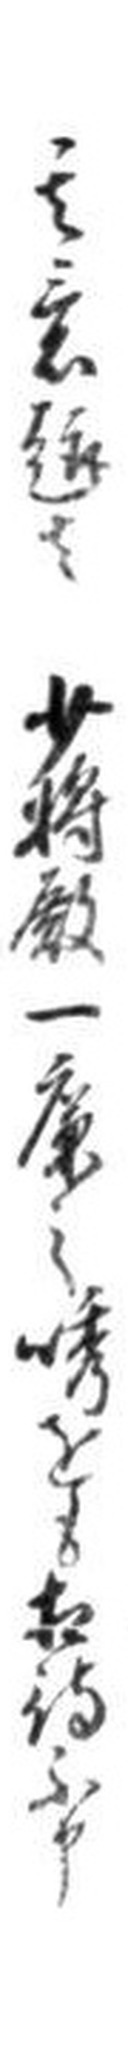其意趣者少将殿一廉之唀をも相待不申
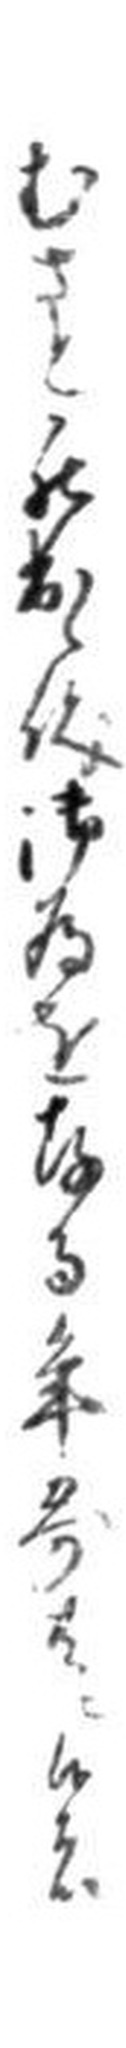むさと罷出候儀御為を存る年寄共ニ候者
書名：家譜 二 忠直公 従文禄四年到慶安四年
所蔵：福井県文書館 Fukui Prefectural Archives
